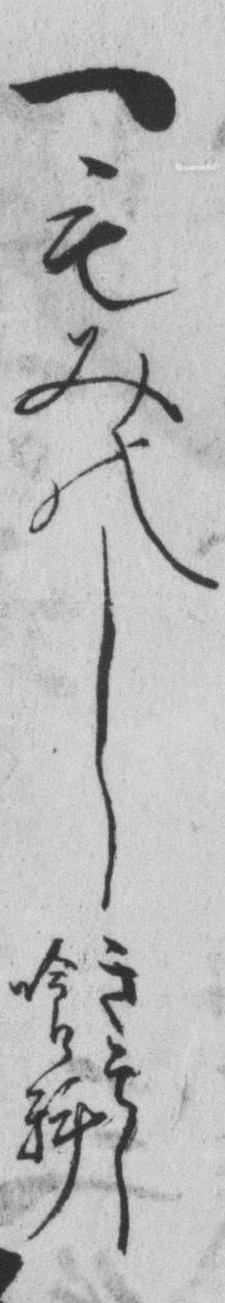一もみのしきそく
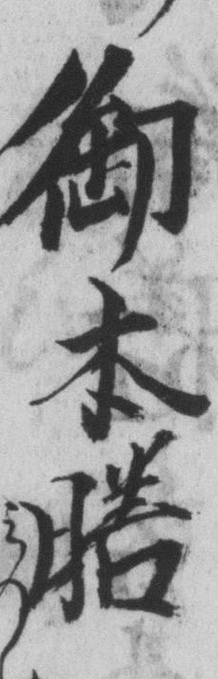御本膳
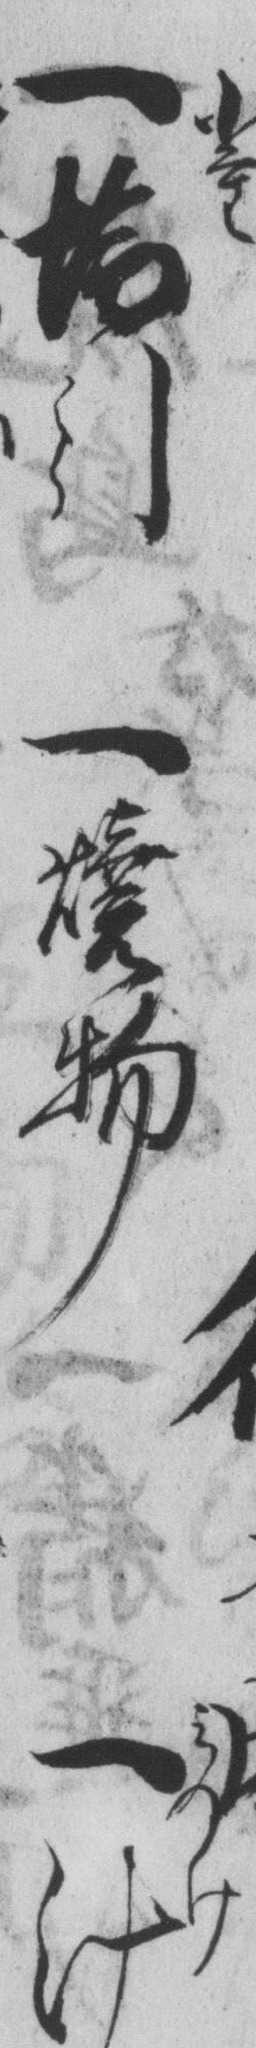一塩引一焼物一汁
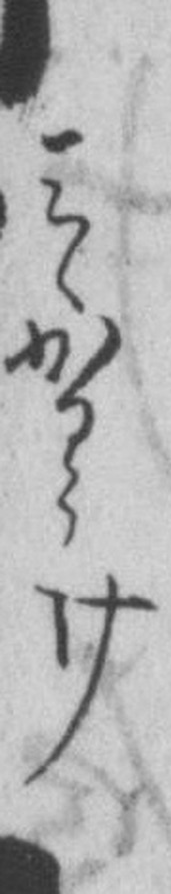みゝかわらけ
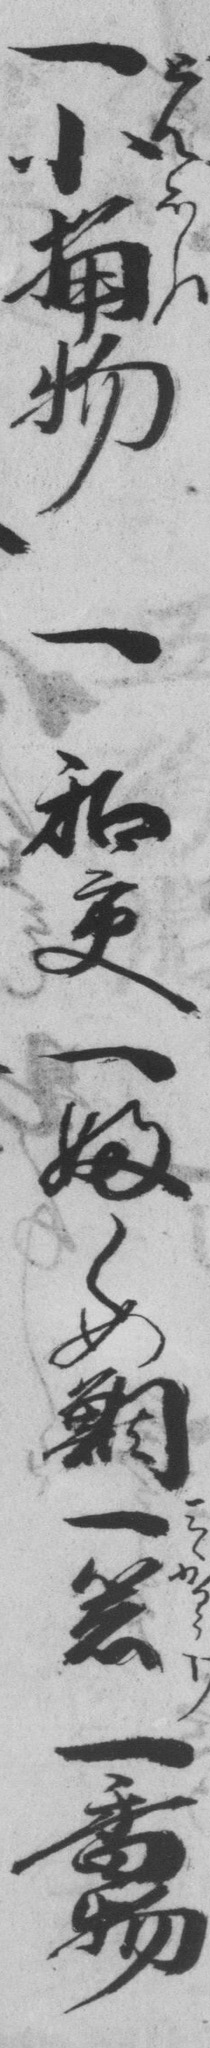一小桶物一初重一ふくめ鯛一器一香物
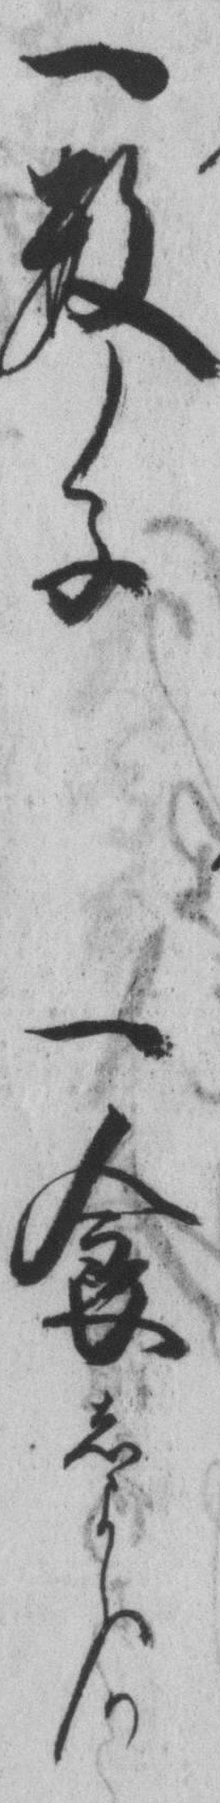一数の子一食しよか
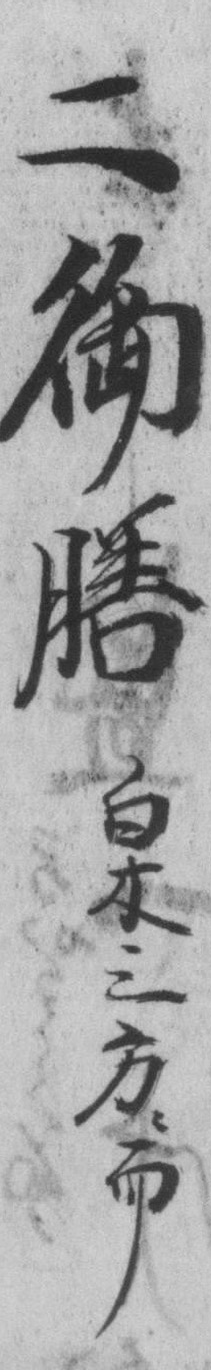二御膳白木三方に而

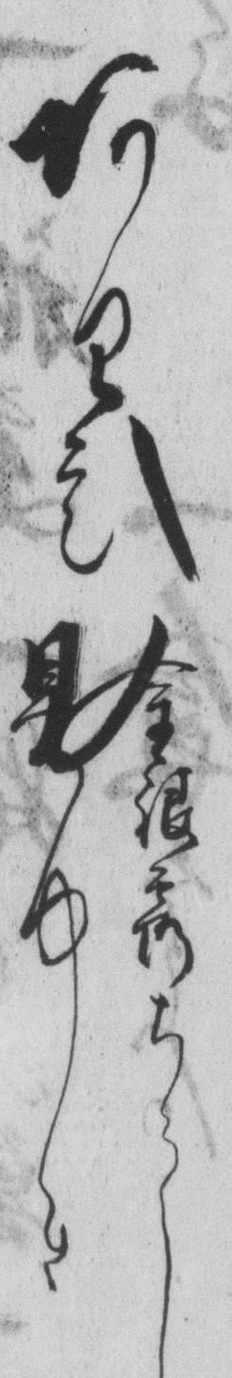あわひ金銀ちらし
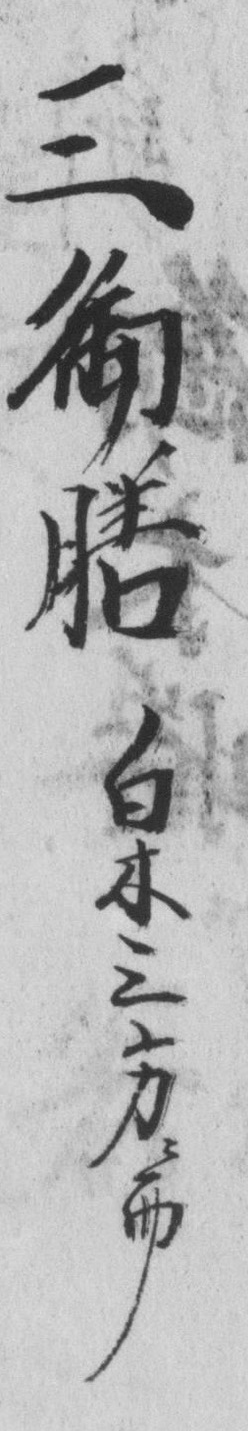三御膳白木三方に而
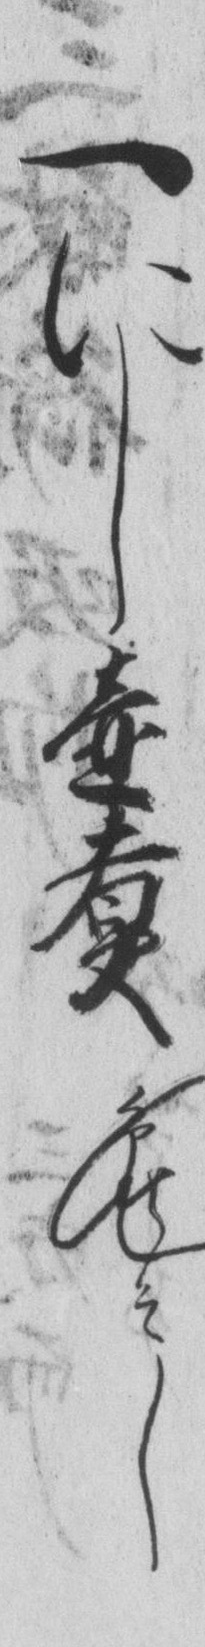一にし壷煮きそく
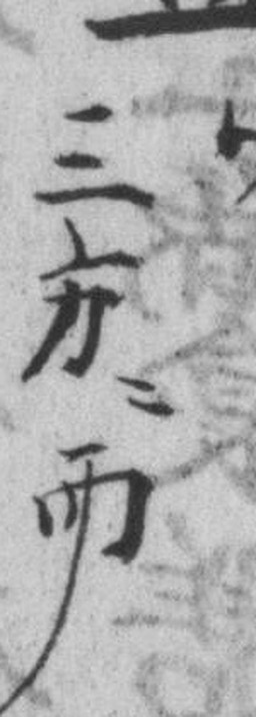三方に而
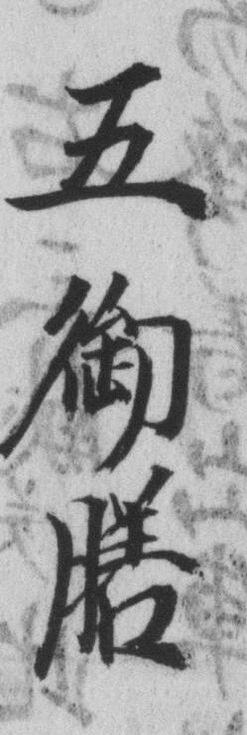五御膳
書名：料理一色集
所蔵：大阪府立大学学術情報センター 国文学研究資料館
